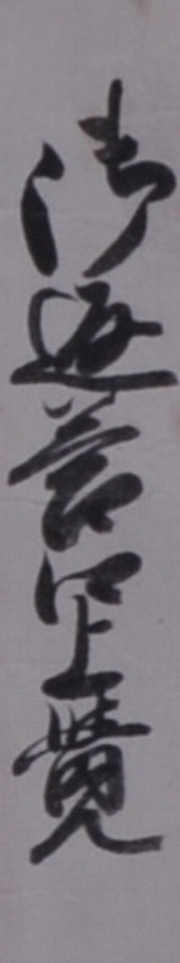御返答口上覚
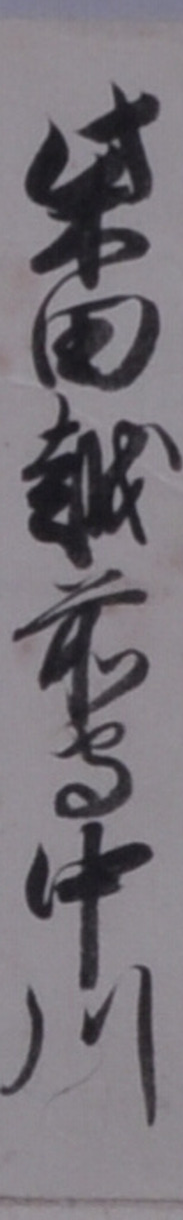柴田越前守中川
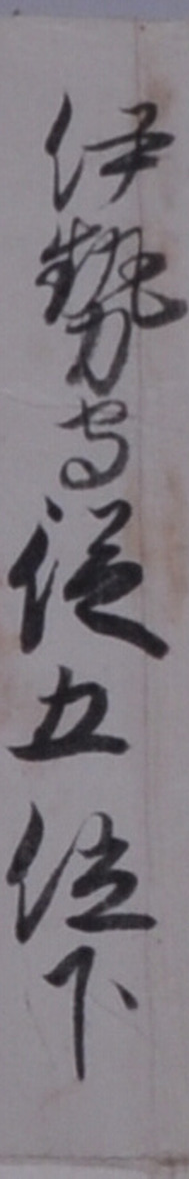伊勢守従五位下
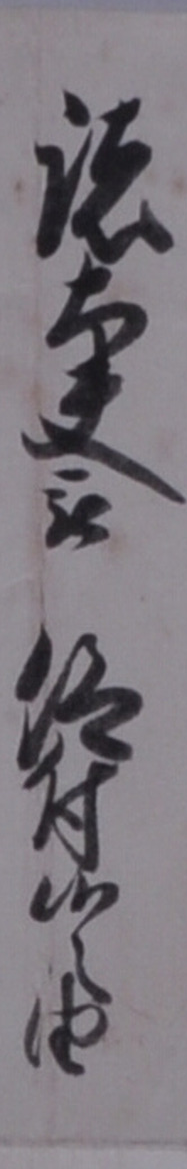諸大夫被仰付候之由
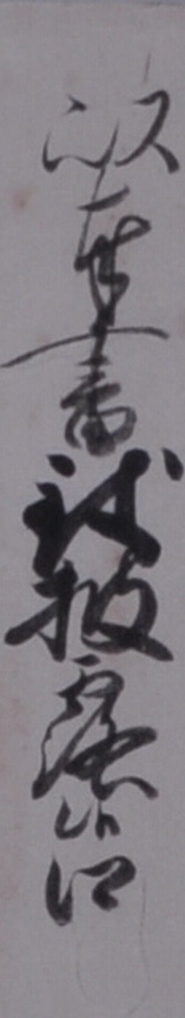以奉書致披露候口
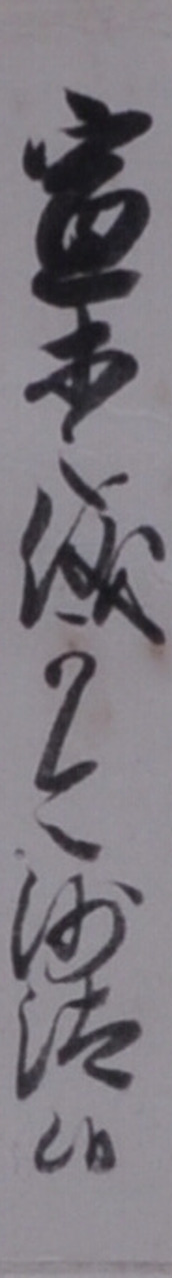宣等之儀可令沙汰候
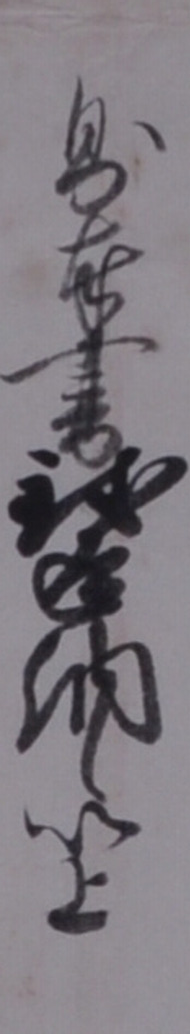則奉書致返納候以上
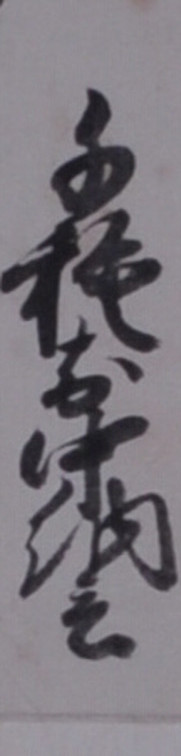千種前中納言
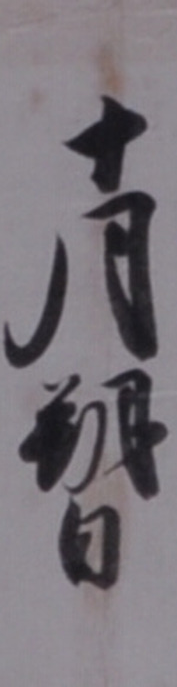十月朔日
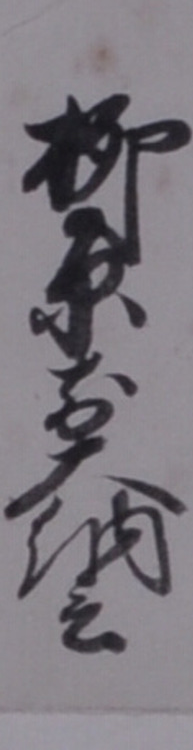柳原前大納言
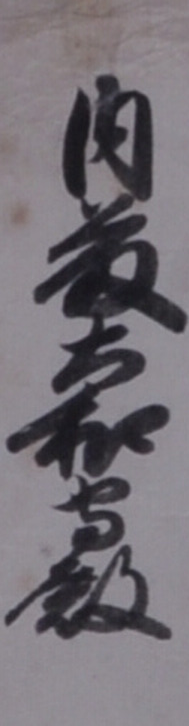内藤大和守殿
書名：御返答口上覚
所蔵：伊那市立高遠町図書館・合同会社AMANE
